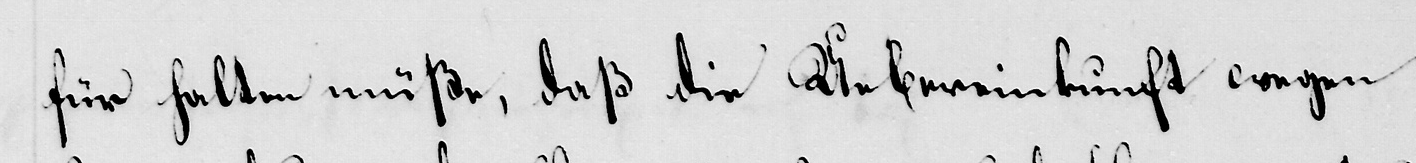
für halten müße, daß die Uebereinkunft wegen
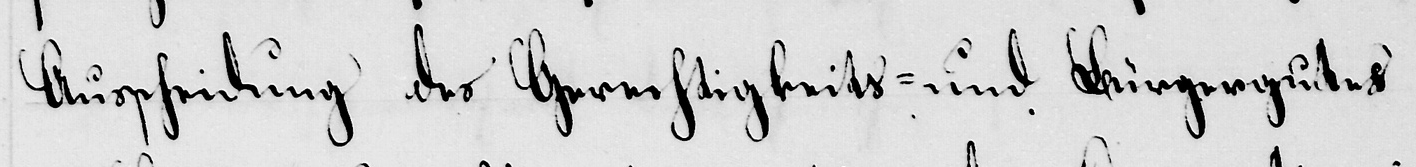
Ausscheidung des Gerechtigkeits- und Bürgergutes
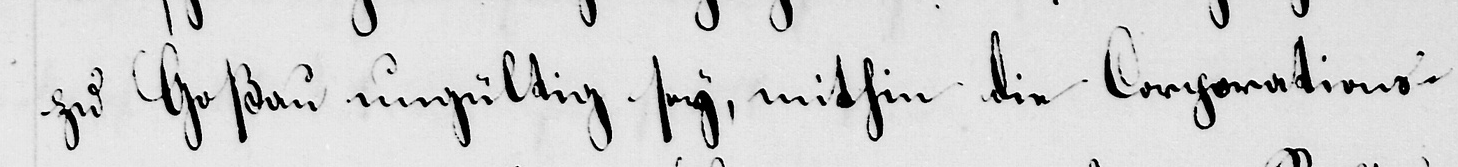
zu Goßau ungültig sey, mithin die Corporations¬
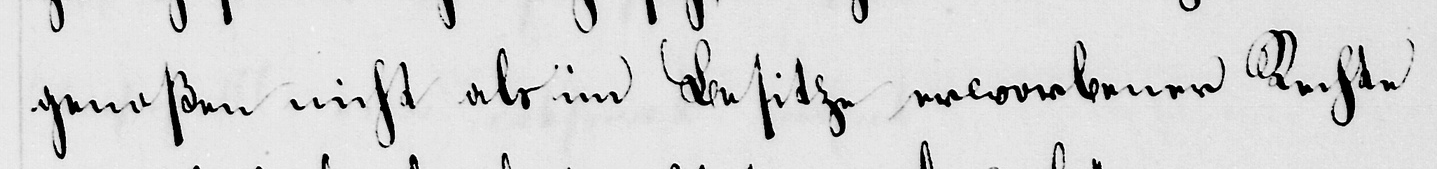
genoßen nicht als im Besitze erworbener Rechte
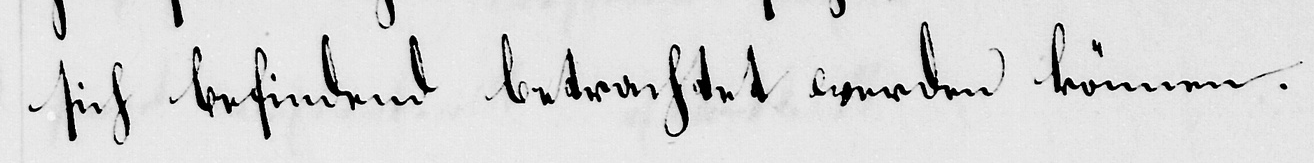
sich befindend betrachtet werden können.
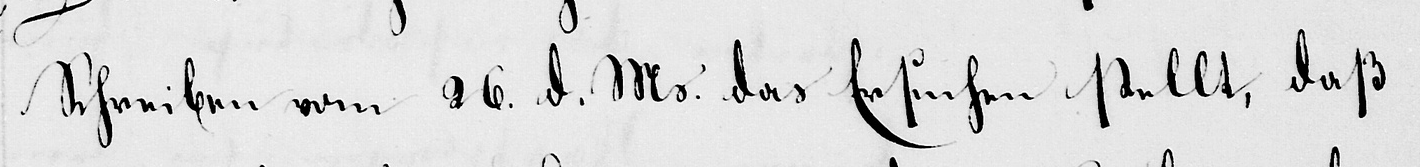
Schreiben vom 26. d. Ms. das Ersuchen stellt, daß
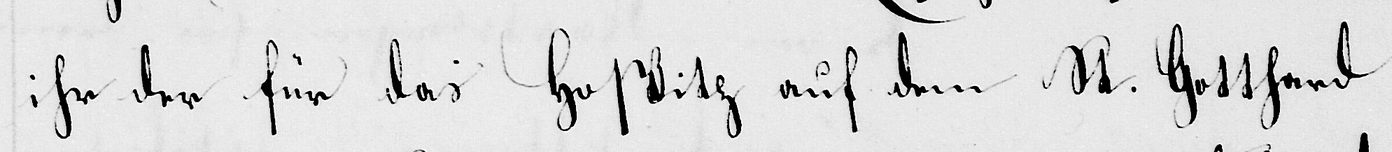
ihr der für das Hospitz auf dem St. Gotthard
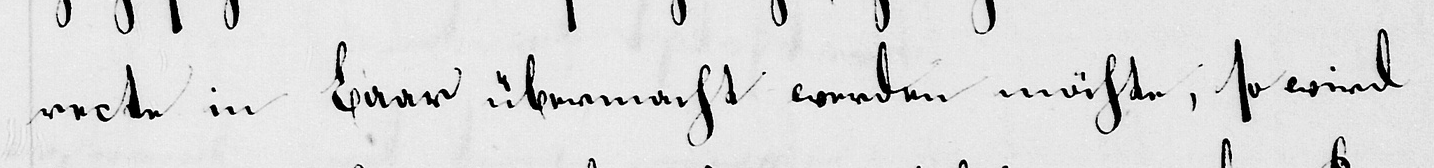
recte in baar überbracht werden möchte, so wird
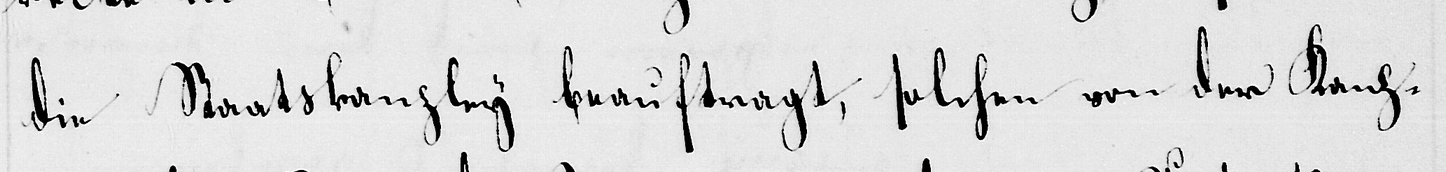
die Staatskanzley beauftragt, solchen von der Kanz¬
